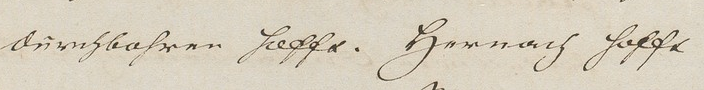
durchbohren hofft. Hernach hofft
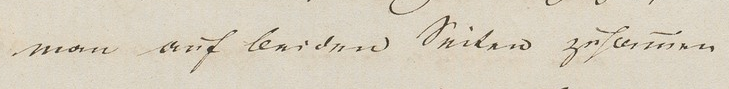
man auf beiden Seiten zusammen
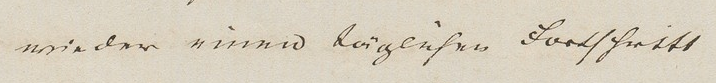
wieder einen täglichen Fortschritt
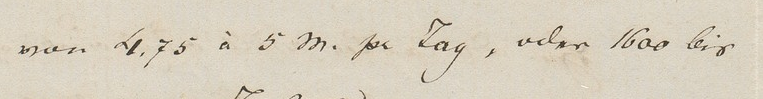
von 4.75 à 5 M. pr Tag, oder 1600 bis
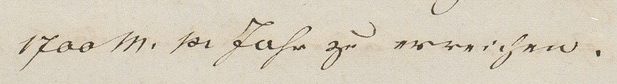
1700 M. pr Jahr zu erreichen.
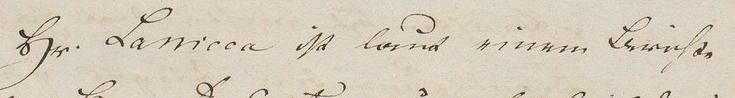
Hr. Lanicca ist laut einem Berichte
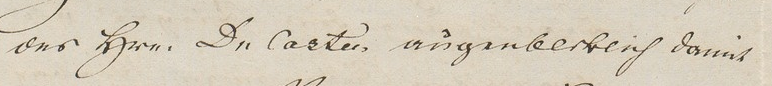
des Hrn. Du Coster augenblicklich damit
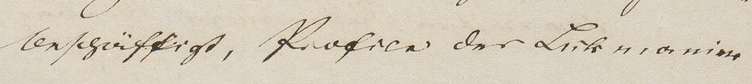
beschäftigt, Profile des Lukmanier
